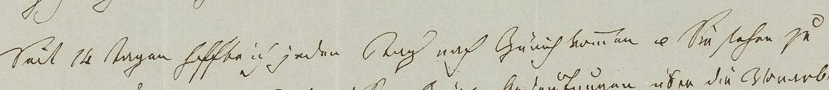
Seit 14 Tagen hoffte ich jeden Tag nach Zürich kommen & Sie sehen zu
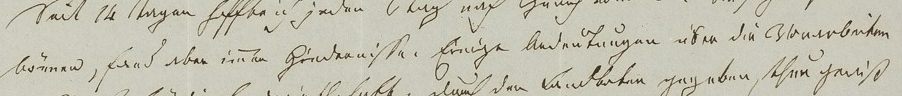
können, fand aber immer Hindernisse. Einige Andeutungen über die Vorarbeiten
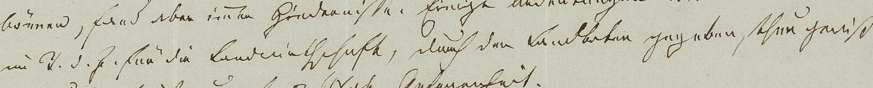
im R. d. I. für die Landwirthschaft durch den Landboten gegeben, thun gewiß
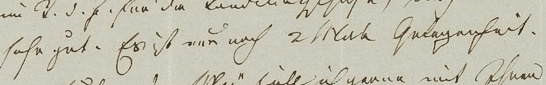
sehr gut. Es ist nun noch 2 Male Gelegenheit.
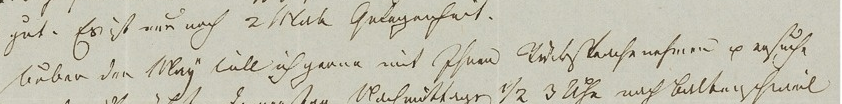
Ueber den May will ich gerne mit Ihnen Rücksprache nehmen & ersuche
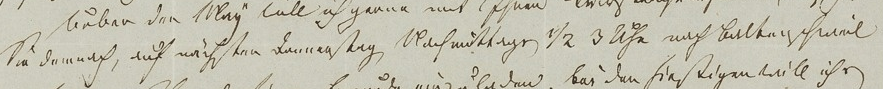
Sie demnach, auf nächsten Donnerstag Nachmittags ½ 3 Uhr nach Baltenschweil
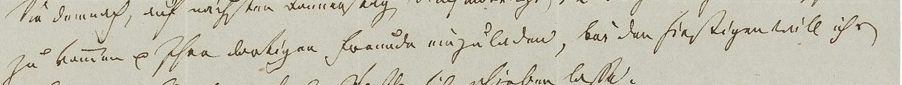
zu kommen & Ihre dortigen Freunde einzuladen, bei den hießigen will ichs
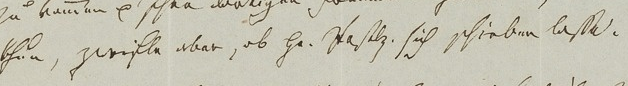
thun, zweifle aber, ob Hr. Pestlz. sich schieben lasse.
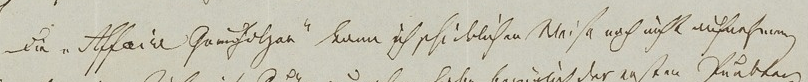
Die «Affaire Grunholzer» kann ich schicklicher Weise noch nicht aufbahnen,
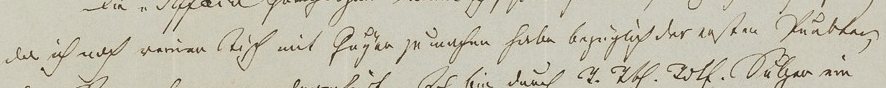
da ich noch reinen Tisch mit Guyer zu machen habe bezüglich des ersten Punktes,
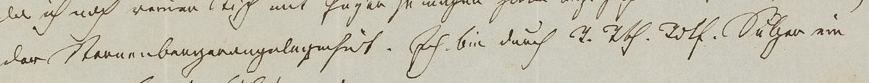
der Sternenbergerangelegenheit. Ich bin durch R.Rth. Rdlf. Sulzer ein
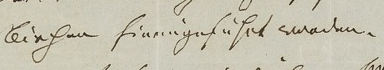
Bischen hineingeführt worden.
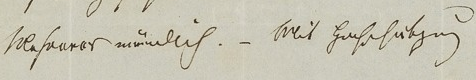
Mehreres mündlich. – Mit Hochschätzung
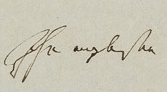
Ihr ergbster
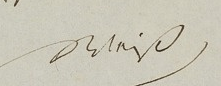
Weiß.
